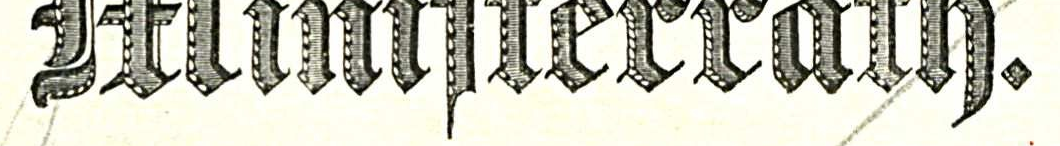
Ministerrath
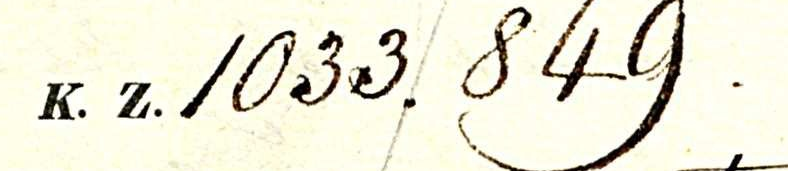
KZ 1033. 849
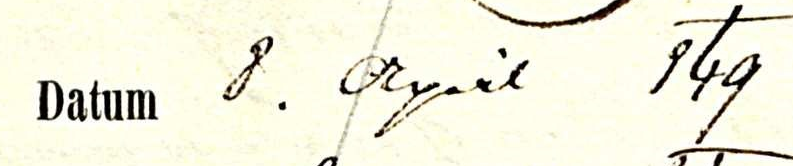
Datum 8. April 849
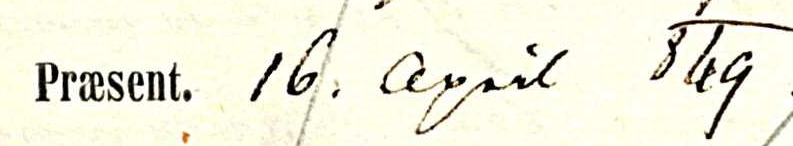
Praesent. 16. April 849
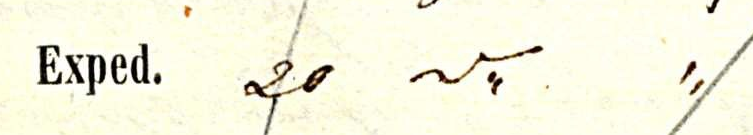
Exped. 20 „ „
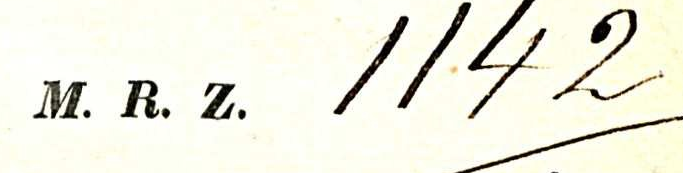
M.R. Z. 1142
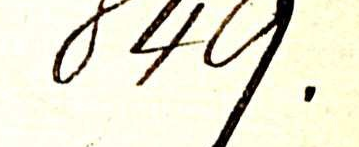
849
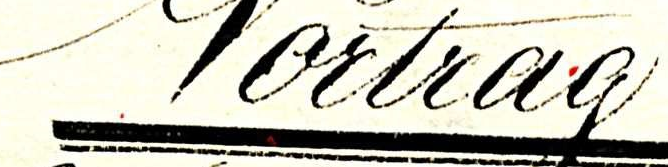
Vortrag
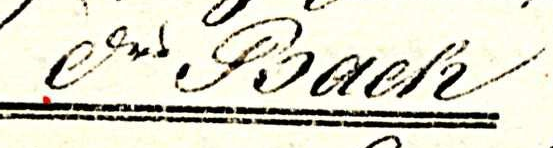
Dr Bach
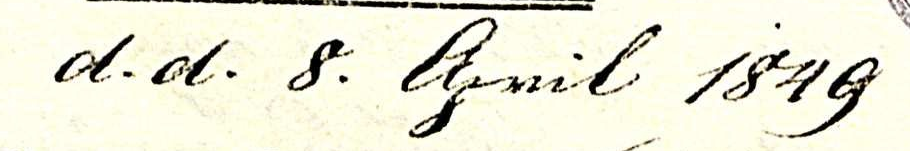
d.d. 8. April 1849
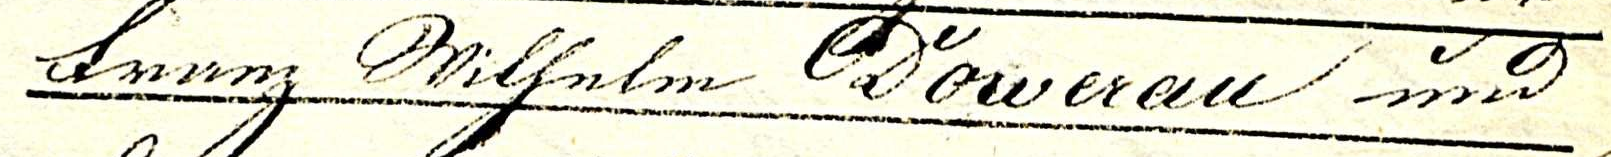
Franz Wilhelm Dowerau und
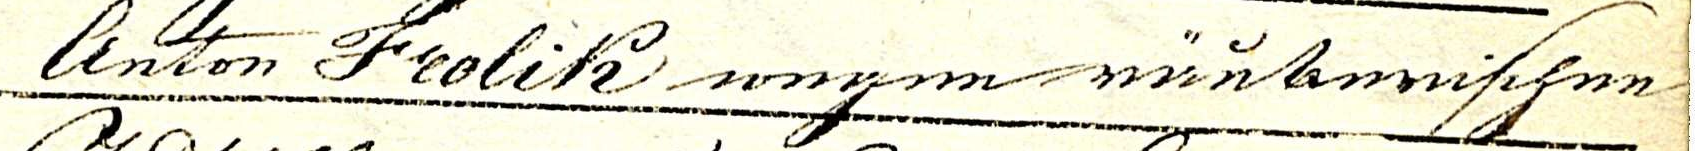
Anton Frolik wegen räuberischen
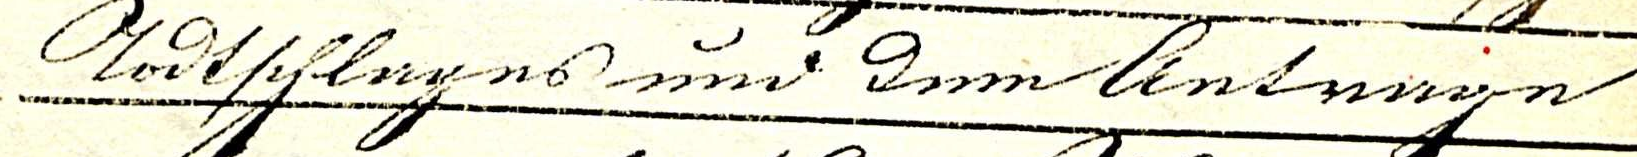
Todtschlages und dem Antrage
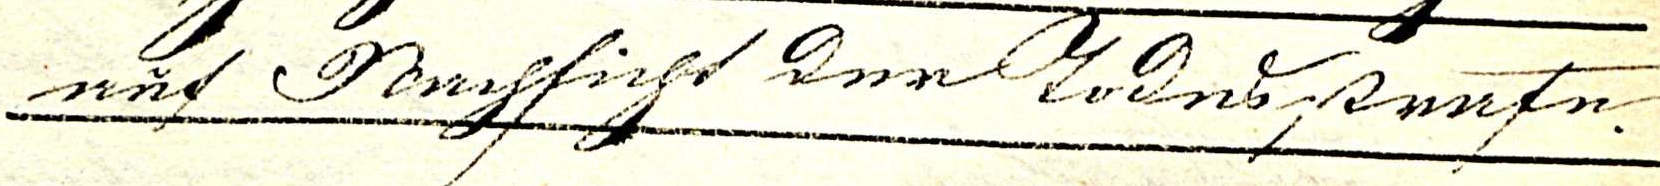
auf Nachsicht der Todesstrafe.
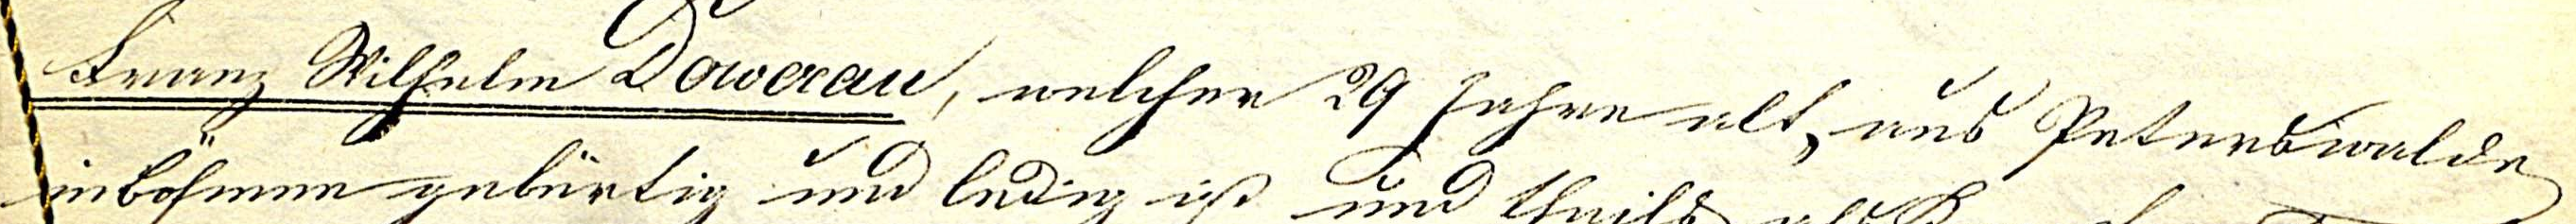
Franz Wilhelm Dowerau, welcher 29 Jahre alt, aus Peterswalde
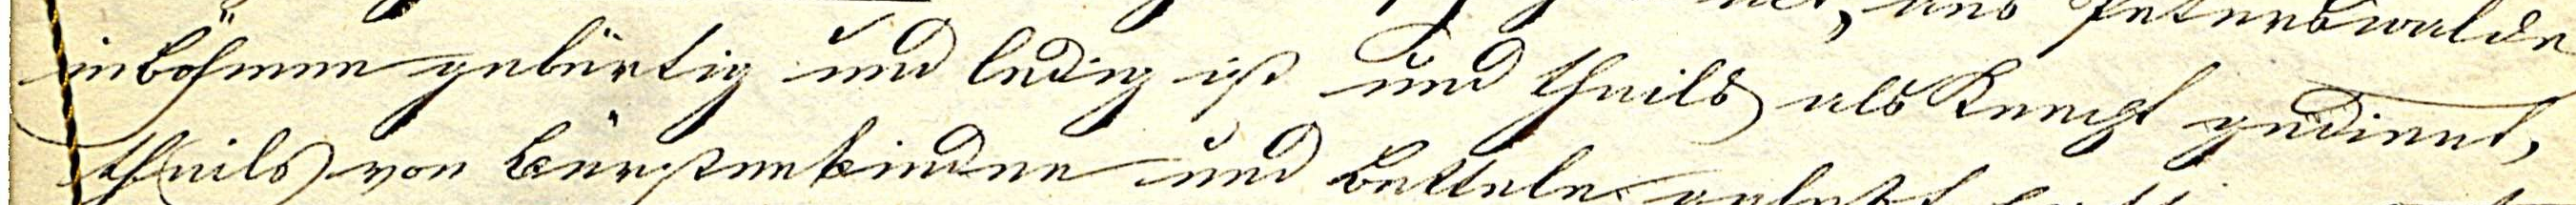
in Böhmen gebürtig und ledig ist und theils als Knecht gedient,
